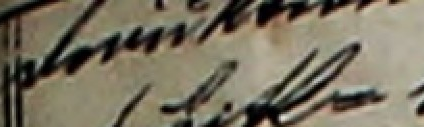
Reduktion auf
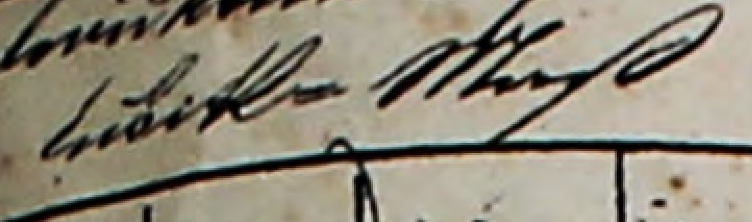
Cubik= Maß
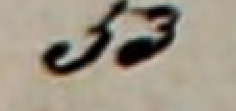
53
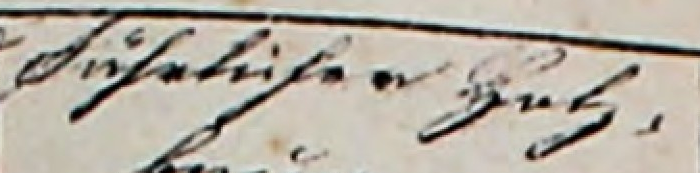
Jährlicher Holz„
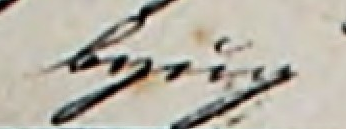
bezug
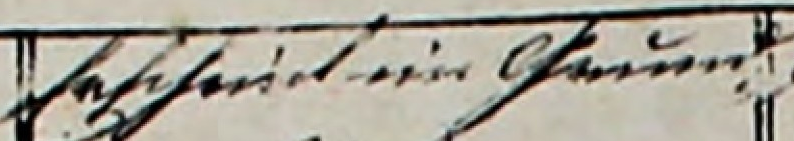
Erscheint im Grund„
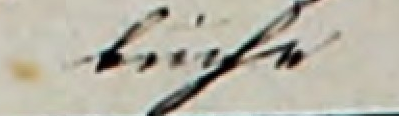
buche
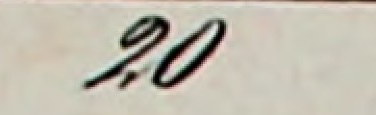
20
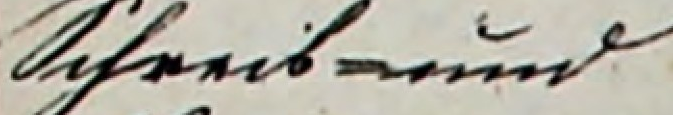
Schreib = und
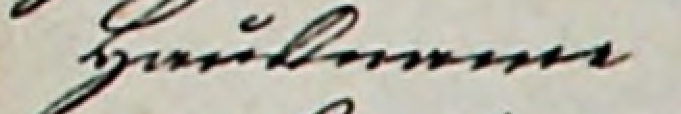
Hausmann
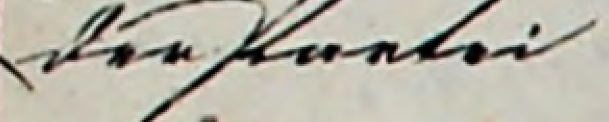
der Partei
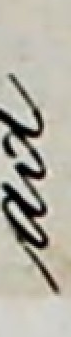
ad
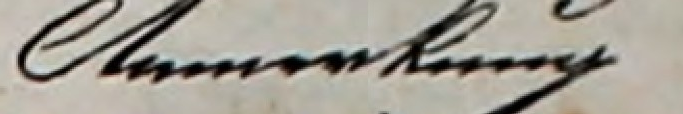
Anmerkung
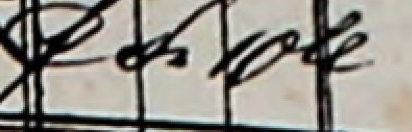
???
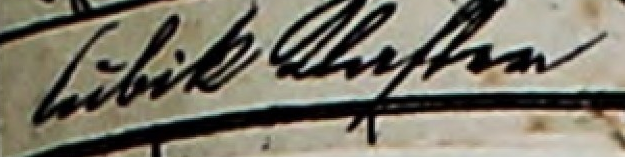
Cubik Klafter
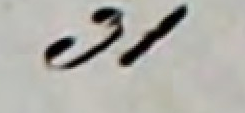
31
